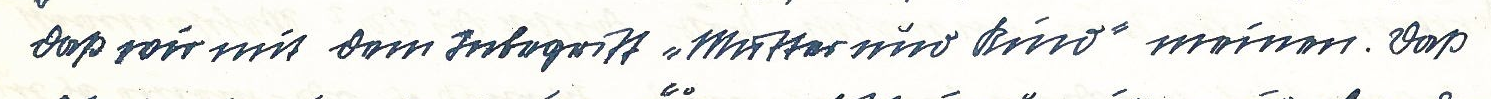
daß wir mit dem Inbegriff „Mutter und Kind“ meinen. Daß
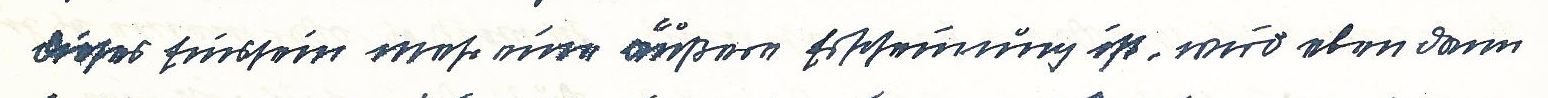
dieses Einssein mehr eine äußere Erscheinung ist, wird eben dann
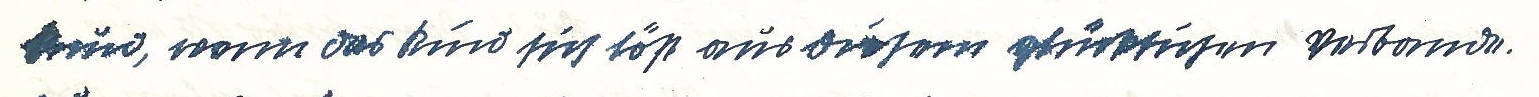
kund, wenn das Kind sich löst aus diesem glücklichen Verbande.
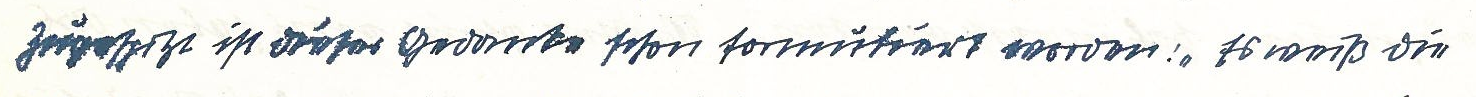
Zugespitzt ist dieser Gedanke schon formuliert worden: „Es weiß die
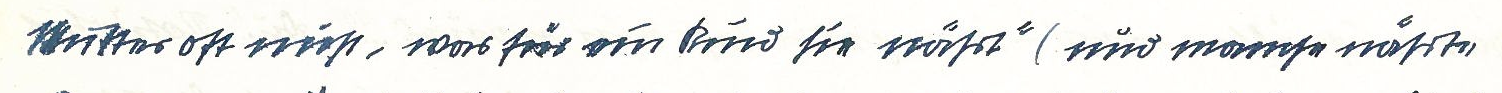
Mutter oft nicht, was für ein Kind sie nährt“ (und manche nährte
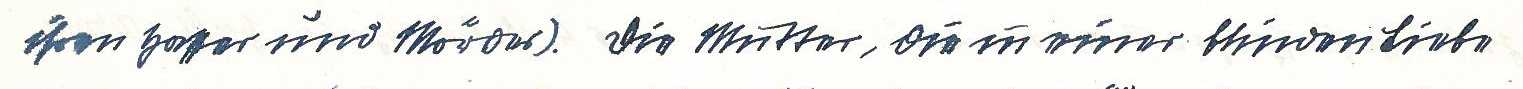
ihren Hasser und Mörder). Die Mutter, die in einer blinden Liebe
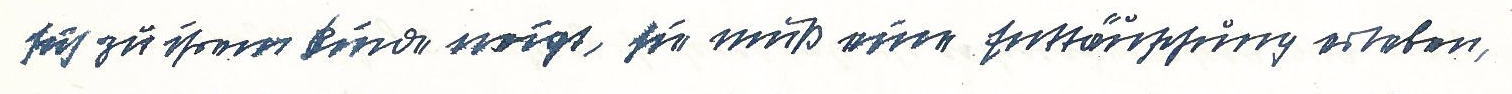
sich zu ihrem Kinde neigt, sie muß eine Enttäuschung erleben,
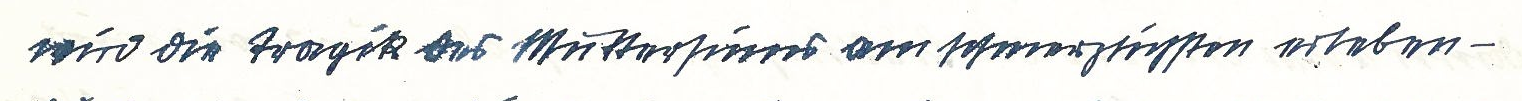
wird die Tragik des Mutterseins am schmerzlichsten erleben –
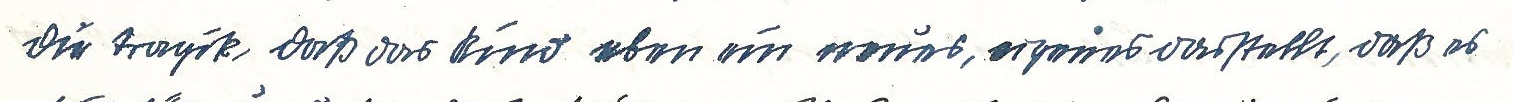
die Tragik, daß das Kind eben ein neues, eigenes darstellt, daß es
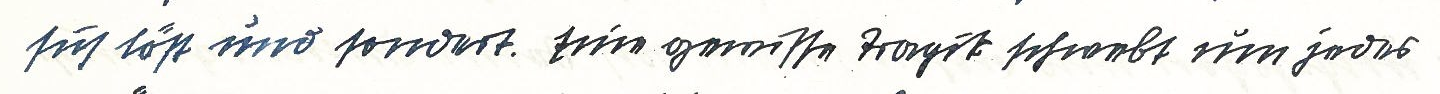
sich löst und sondert. Eine gewisse Tragik schwebt um jedes
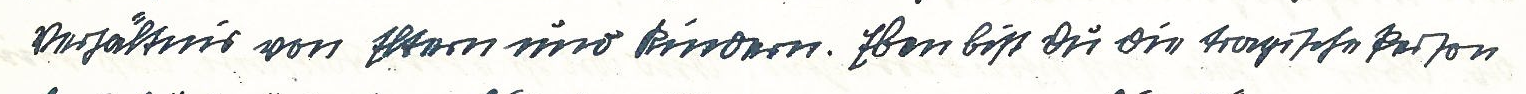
Verhältnis von Eltern und Kindern. Eben bist Du die tragische Person
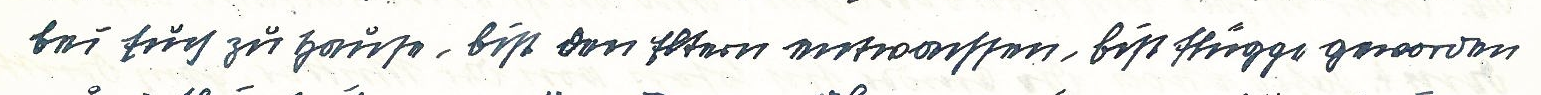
bei Euch zu Hause, bist den Eltern entwachsen, bist flügge geworden
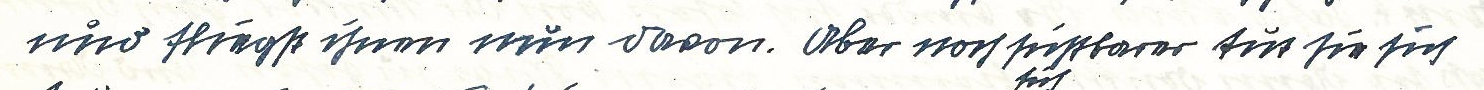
und fliegst ihnen nun davon. Aber noch sichtbarer tut sie sich
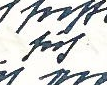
sich
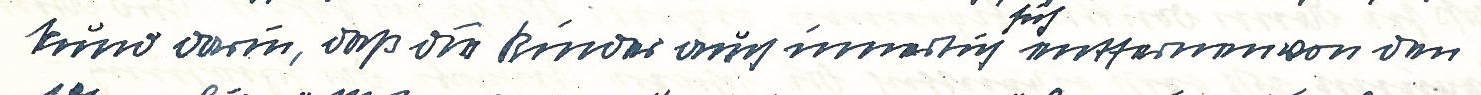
kund darin, daß die Kinder auch innerlich entfernen von den
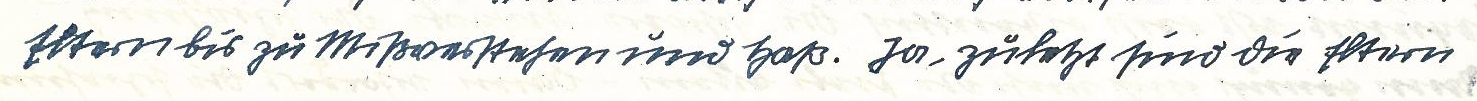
Eltern bis zu Mißverstehen und Haß. Ja, zuletzt sind die Eltern
